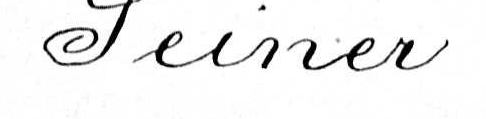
Seiner
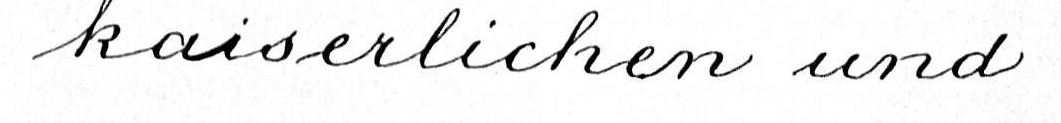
kaiserlichen und
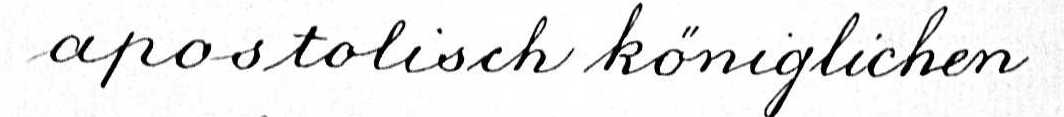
apostolisch königlichen
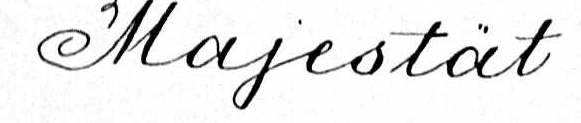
Majestät
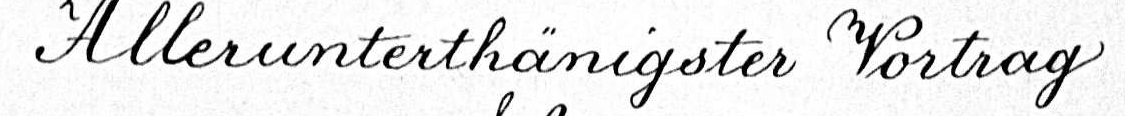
Allerunterthänigster Vortrag
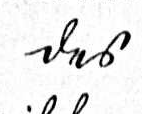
Des
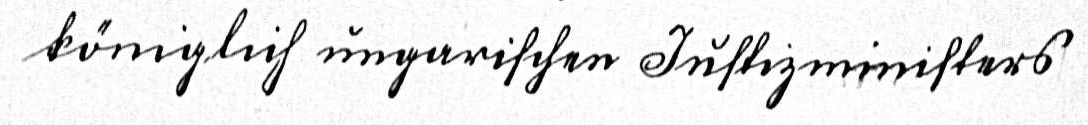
königlich ungarischen Justizministers
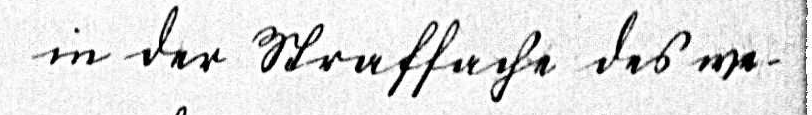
in der Strafsache des we¬
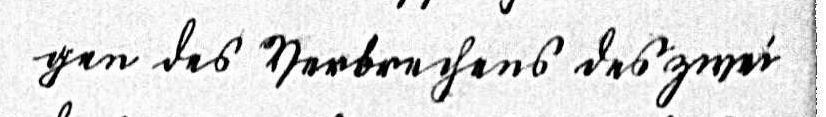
gen des Verbrechens des zwei¬
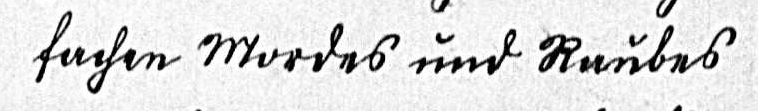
fachen Mordes und Raubes
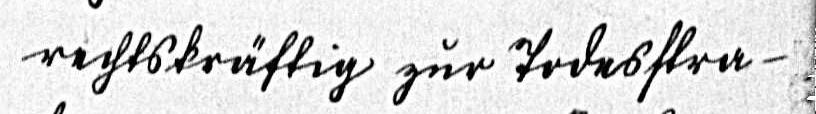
rechtskräftig zur Todesstra¬
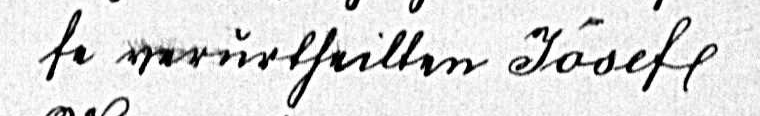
fe verurtheilten Jósef
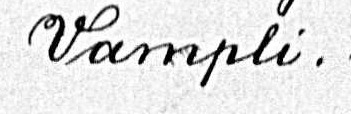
Vampli.
